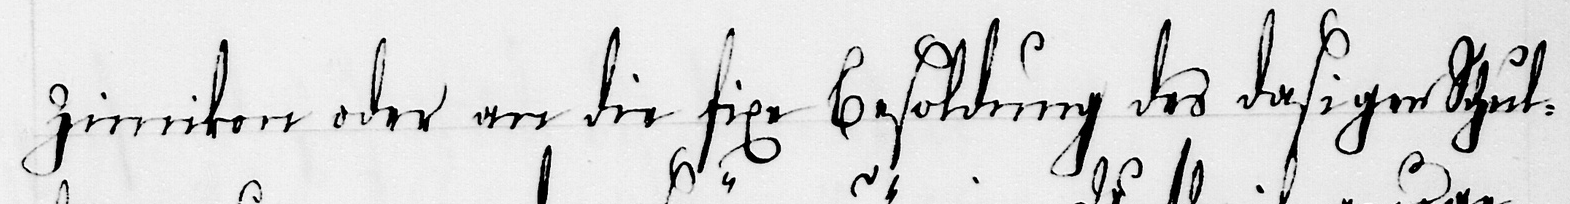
Zimikon oder an die fixe Besoldung des dasigen Schul¬
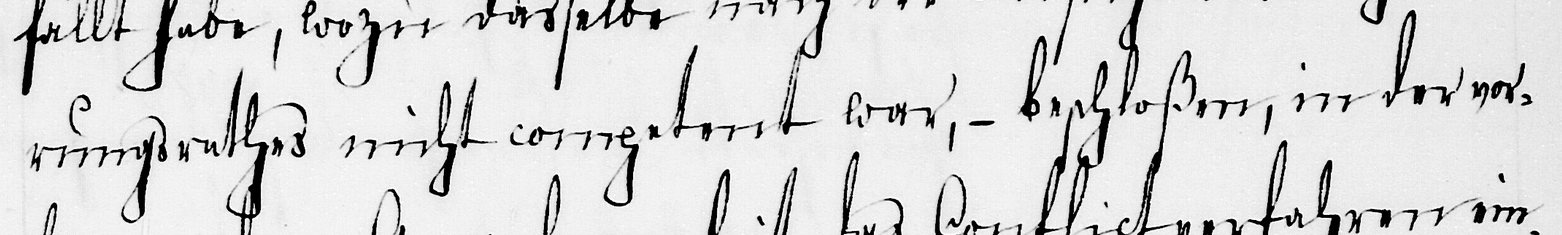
rungsrathes nicht competent war, − beschloßen, in der vor¬
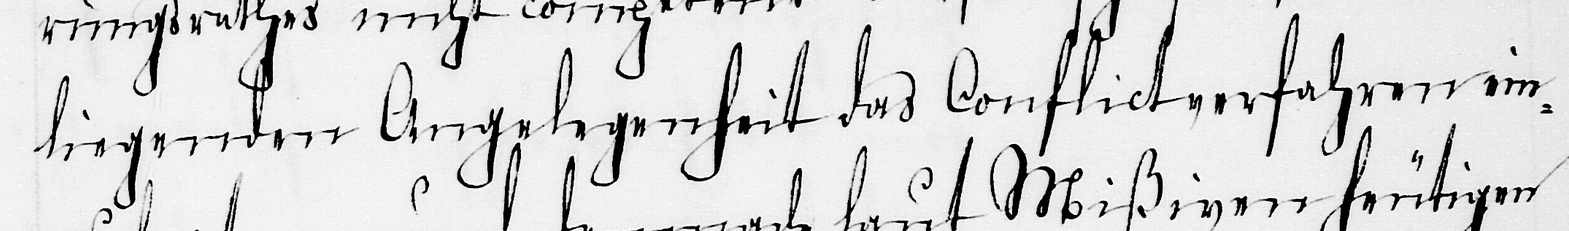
liegenden Angelegenheit das Conflictverfahren ein¬
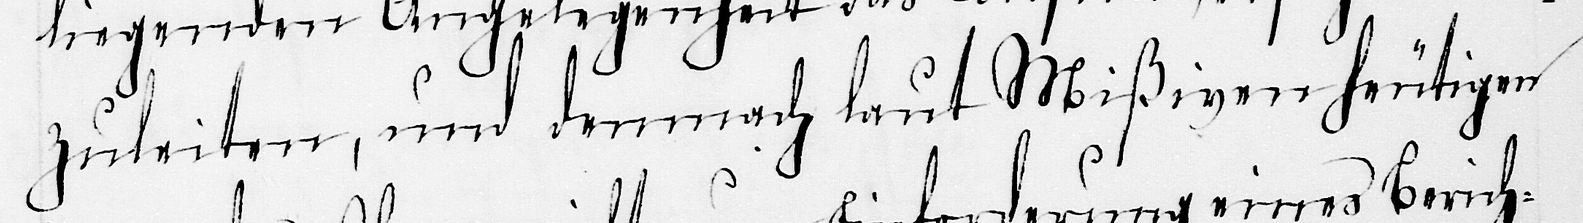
zuleiten, und demnach laut Mißiven heutigen
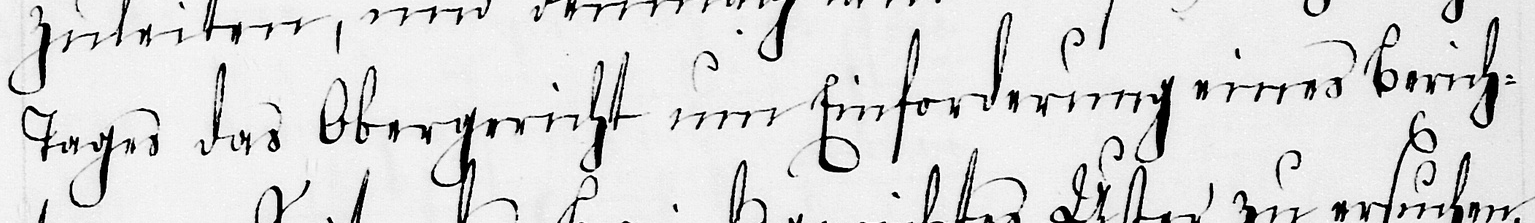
Tages das Obergericht um Einforderung eines Berich¬
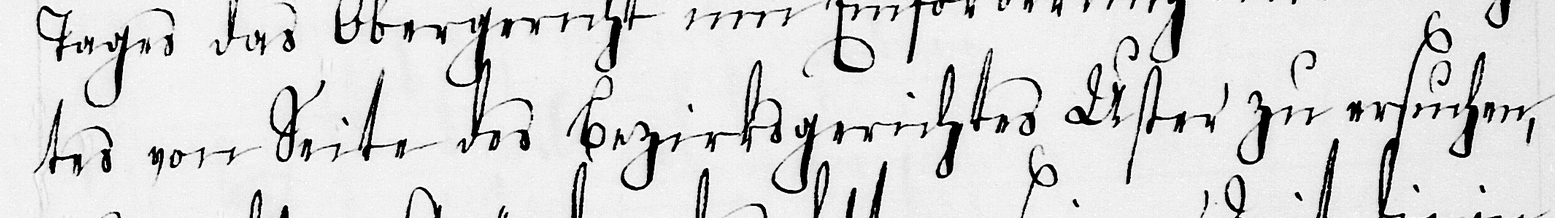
tes von Seite des Bezirksgerichtes Uster zu ersuchen,
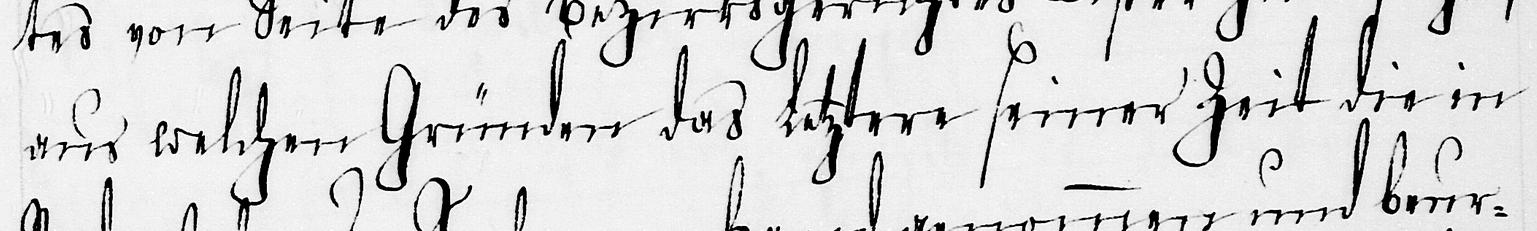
aus welchen Gründen das Letztere seiner Zeit die in
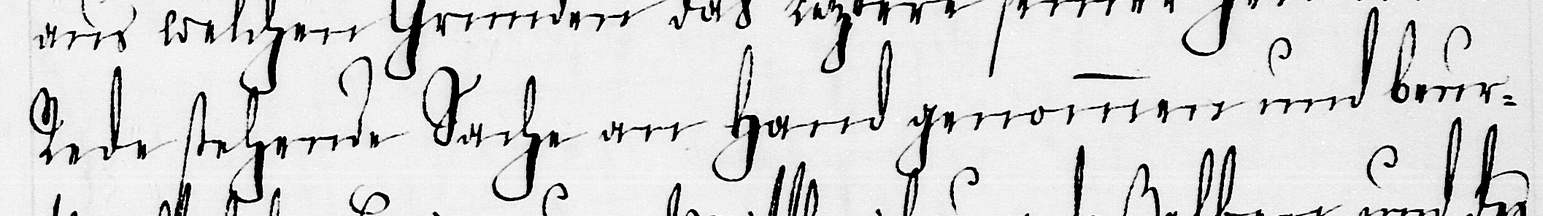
Rede stehende Sache an Hand genommen und beur¬
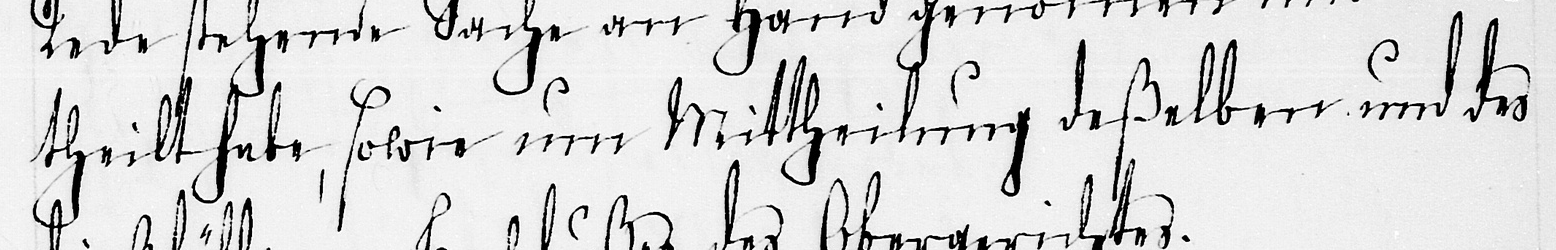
theilt habe, sowie um Mittheilung deßelben und des
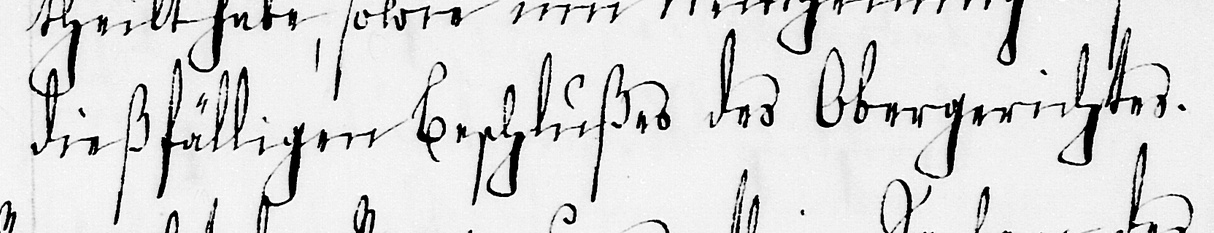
dießfälligen Beschlußes des Obergerichtes.
